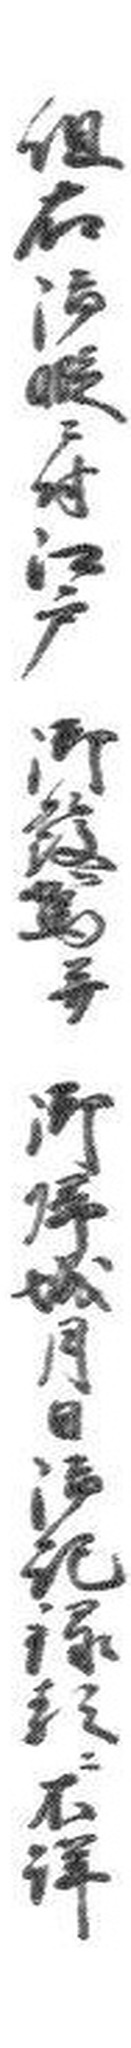但右御暇ニ付江戸御発駕并御帰城月日御記録類ニ不詳
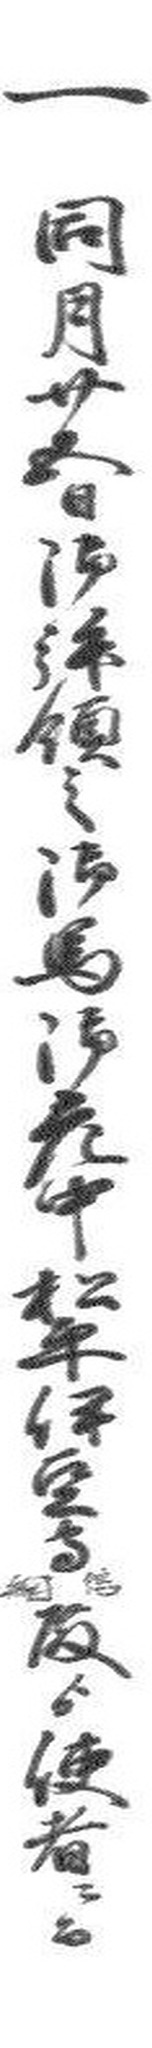一同月廿五日御拝領之御馬御老中松平伊豆守信綱殿ゟ使者ニ而
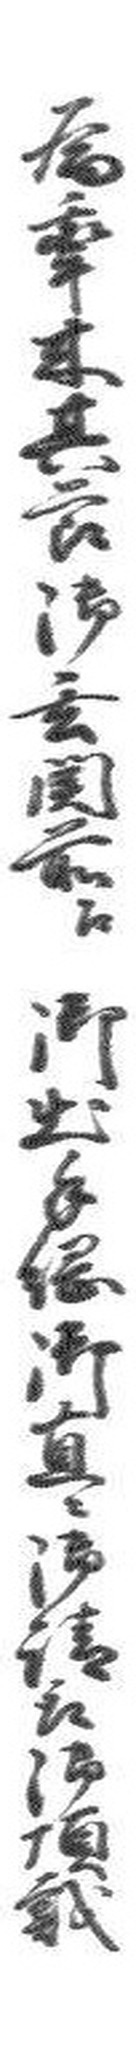為率来其節御玄関前江御出手綱御直ニ御請取御頂戴
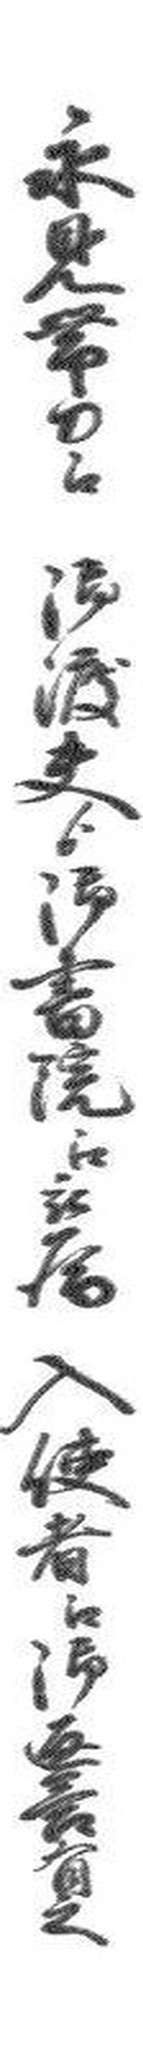永見帯刀江御渡夫ゟ御書院江被為入使者江御返答有之
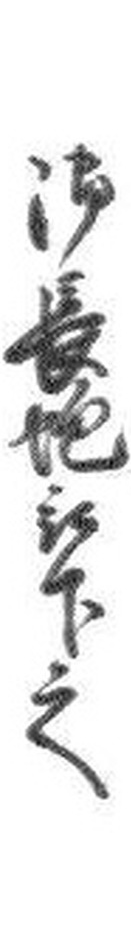御長蚫被下之
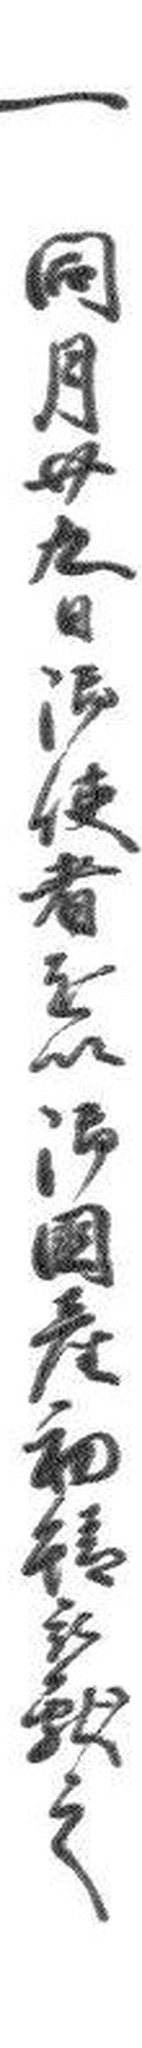一同月廿九日御使者を以御国産初鯖被献之

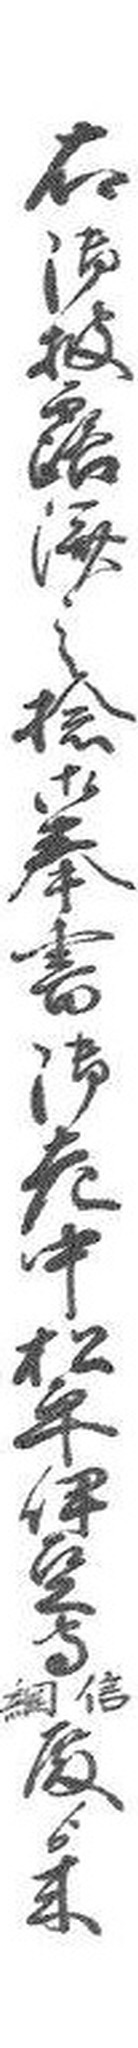右御披露済之捻御奉書御老中松平伊豆守信綱殿ゟ来
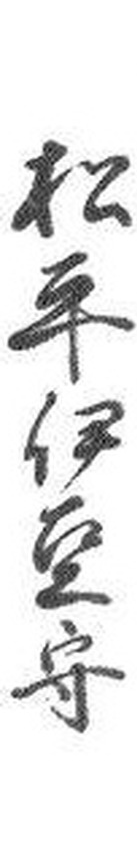松平伊豆守
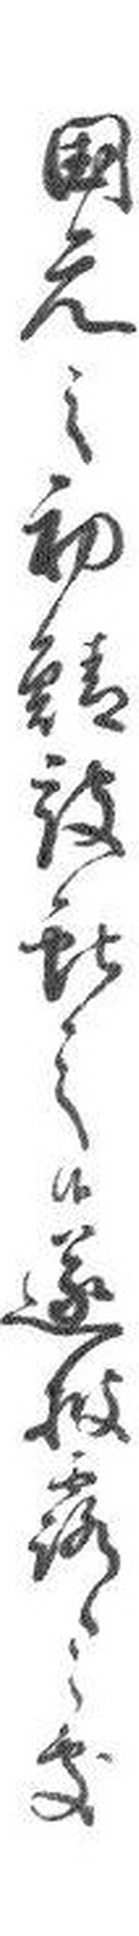国元之初鯖被献之候遂披露候之処
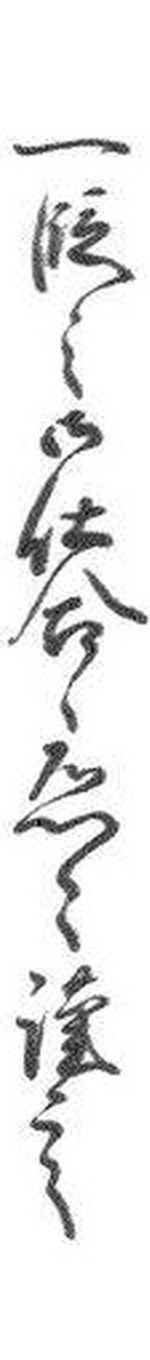一段之御仕合候恐々謹言
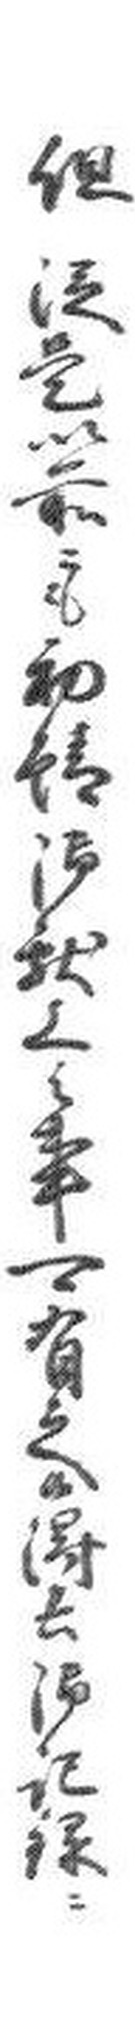但従是以前ニも初鯖御献上之事可有之候得共御記録ニ
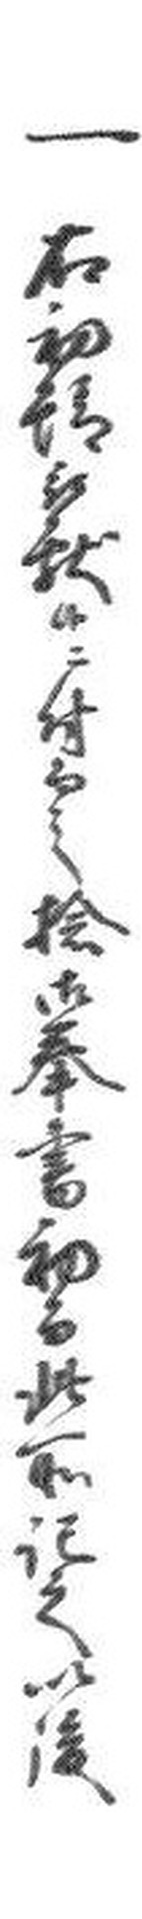一右初鯖被献候ニ付而之捨御奉書初而此所記之以後
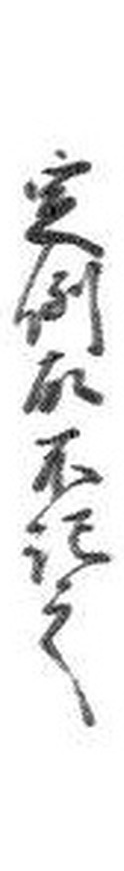定例故不記之
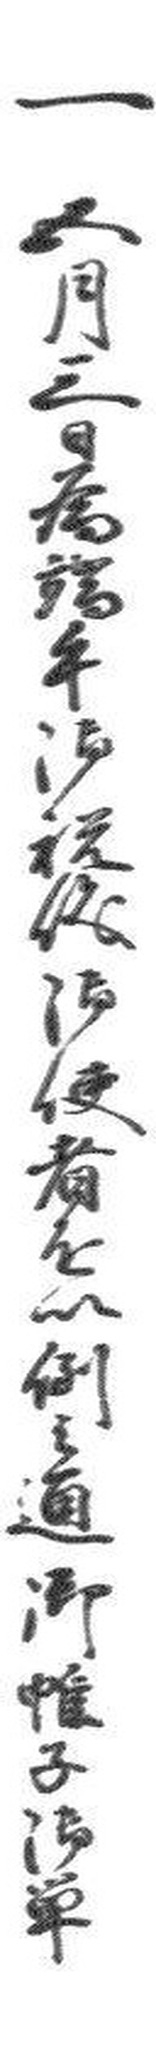一五月三日為端午御祝儀御使者を以例之通御帷子御単
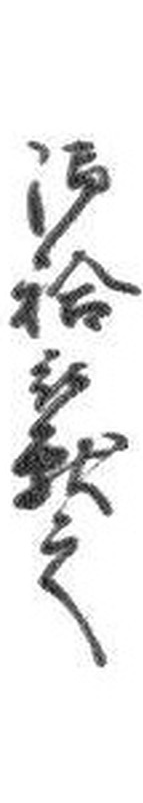御袷被献之
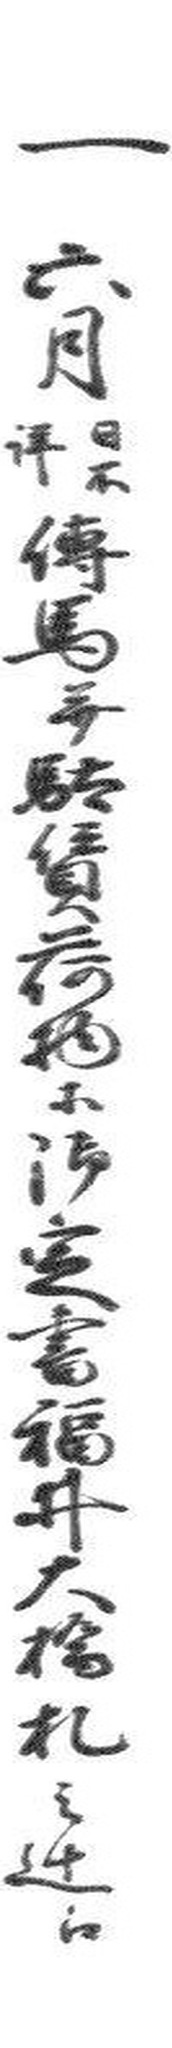一六月日不詳伝馬并駄賃荷物等御定書福井大橋札之辻江
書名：家譜 六 光通公 従万治三年到寛文三年
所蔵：福井県文書館 Fukui Prefectural Archives
